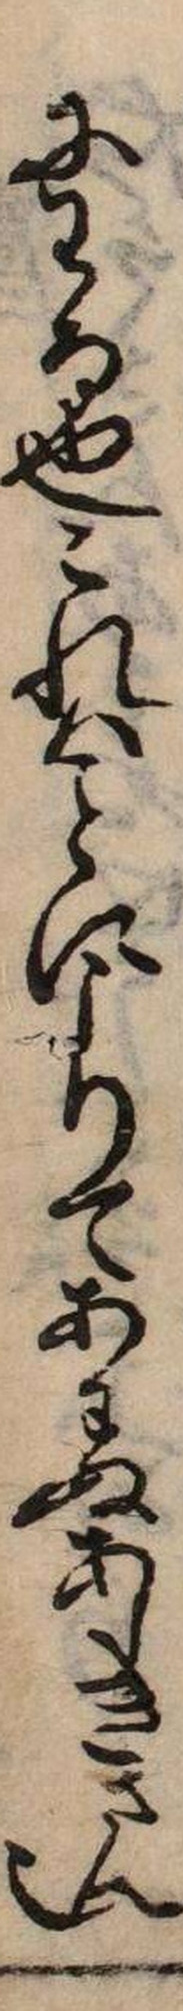にわる也これはことによりてあわぬあしきさん也

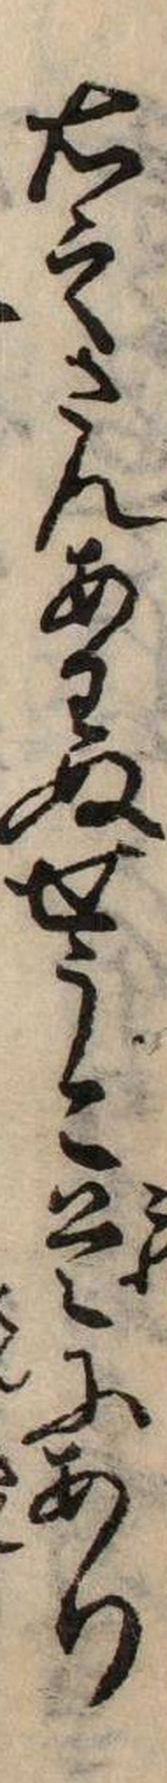右のさんあわぬせうこ是にあり
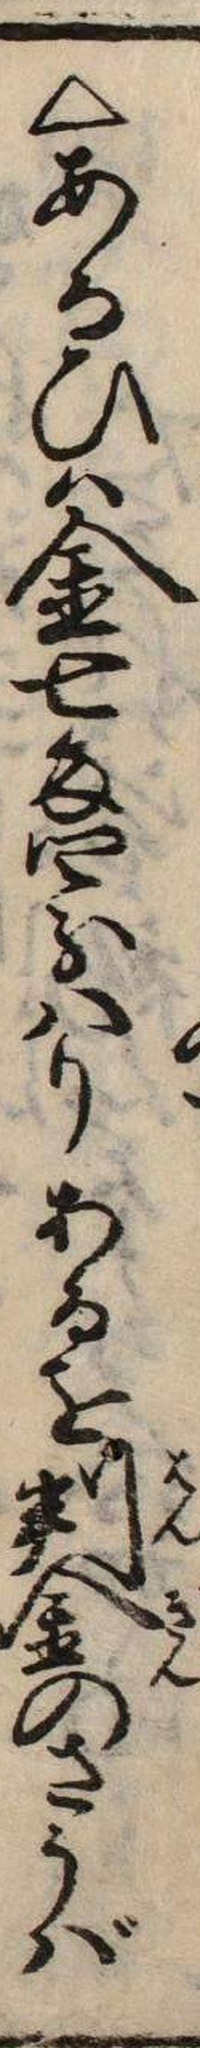△あるひは金七匁四分八りあるを判金のさうば
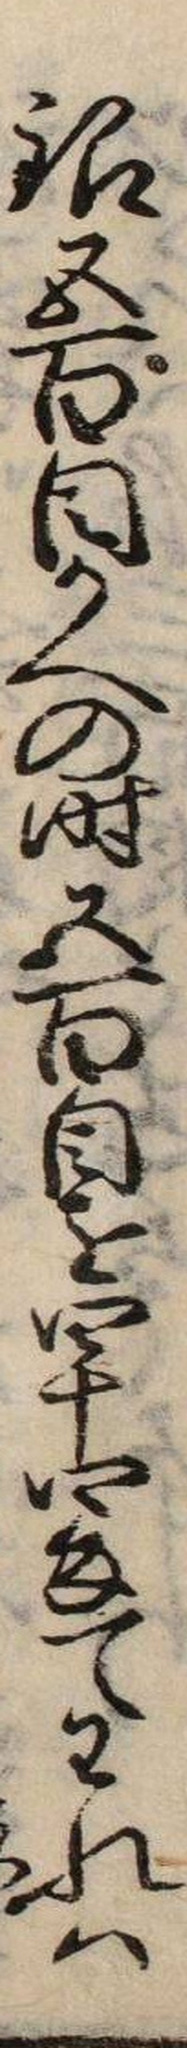銀五百目かへの時五百目を四十四匁てわれは
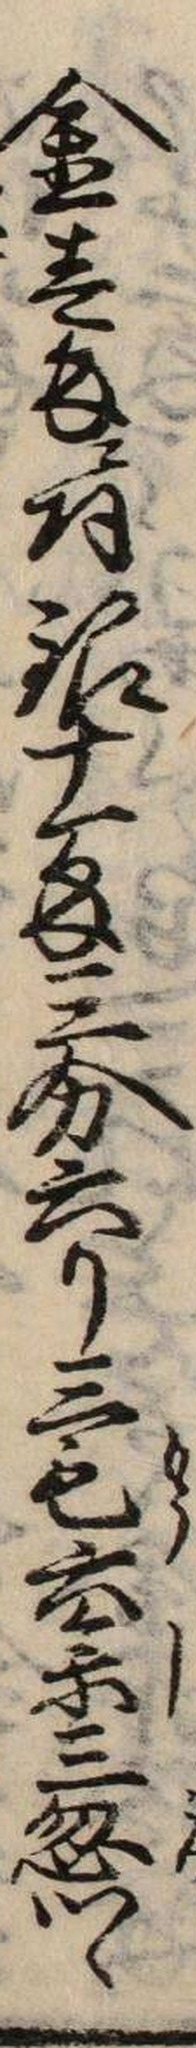金壱匁に付銀十一匁三分六り三毛六糸三忽つゝ
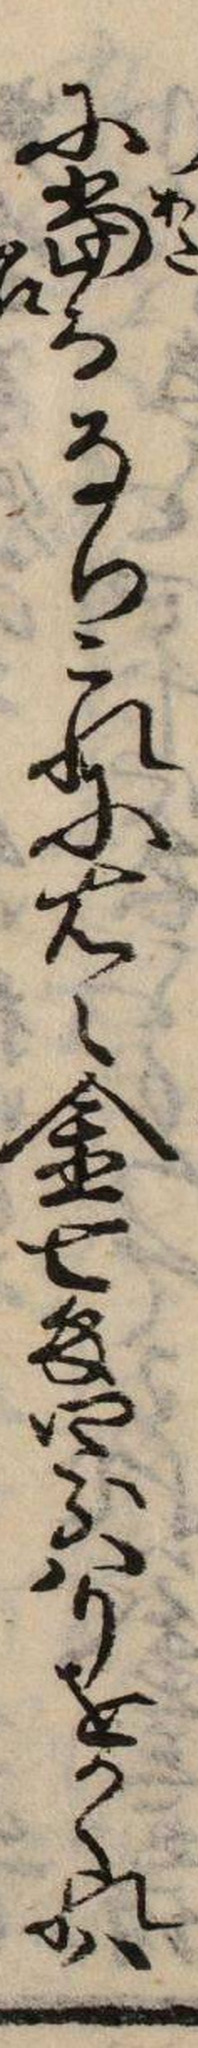に当るなりこれに右の金七匁四分八りをかくれは
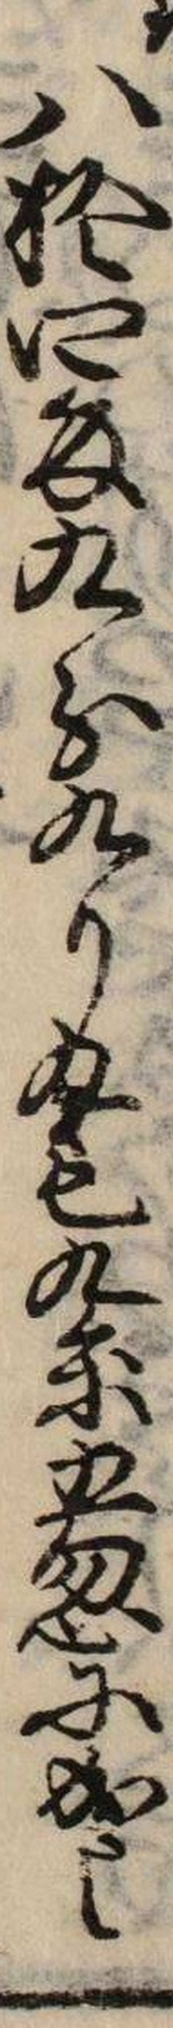銀八拾四匁九分九り九毛九糸五忽に成申候
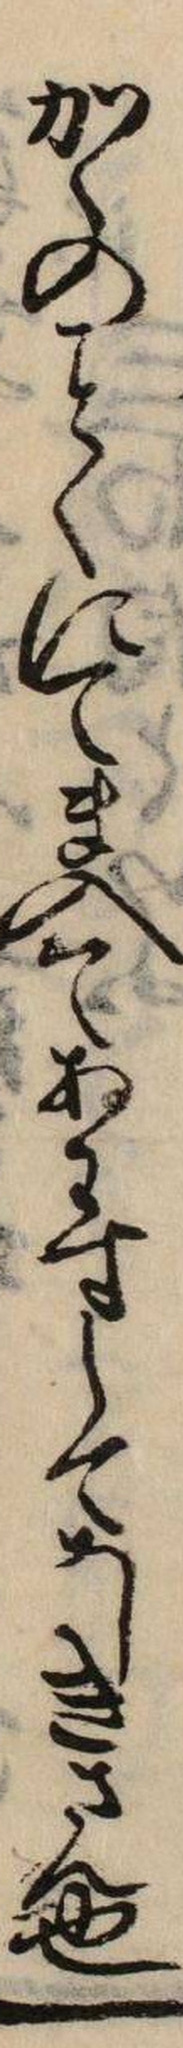かくのことくにてま入てあわすしてあしきさん也
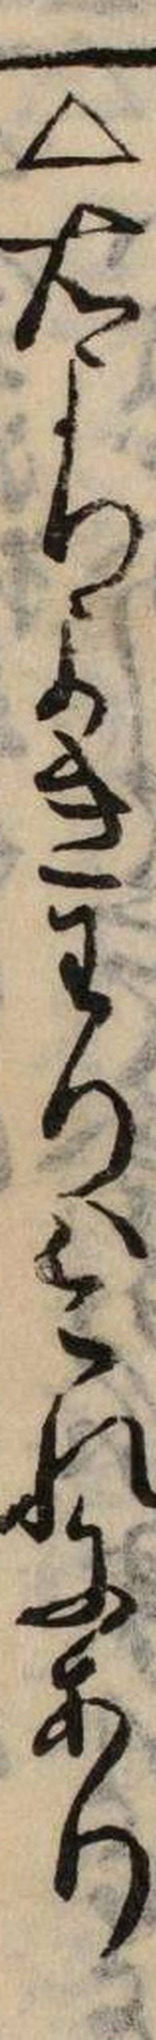△右よりよきわりはこれにあり
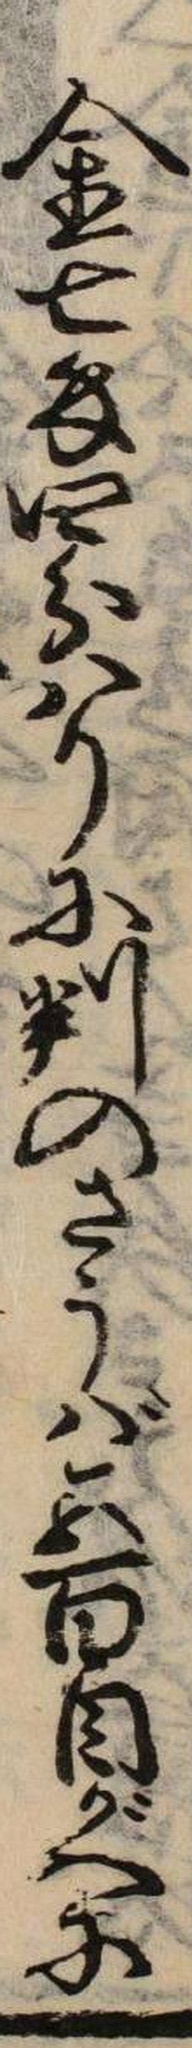金七匁四分八りに判のさうば五百目がへに
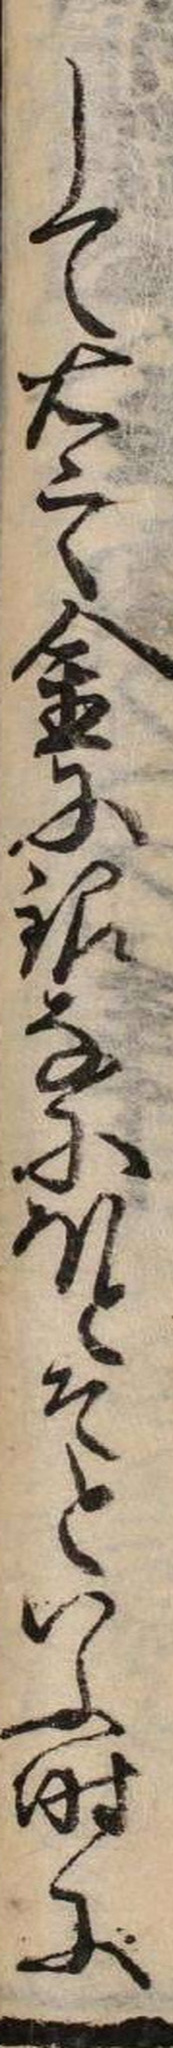して右の金に銀なにほとそといふ時に
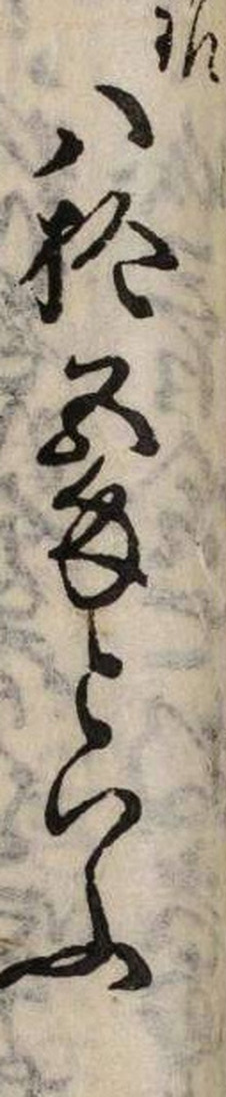銀八拾五匁といふ
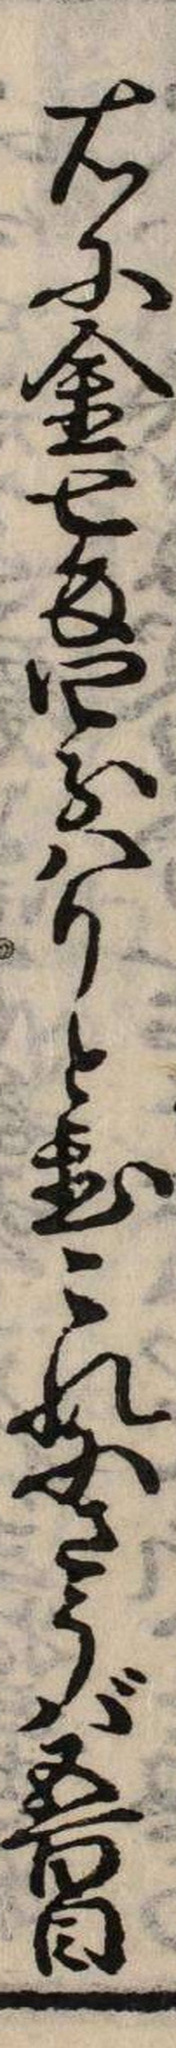右に金七匁四分八りと置これにさうば五百目
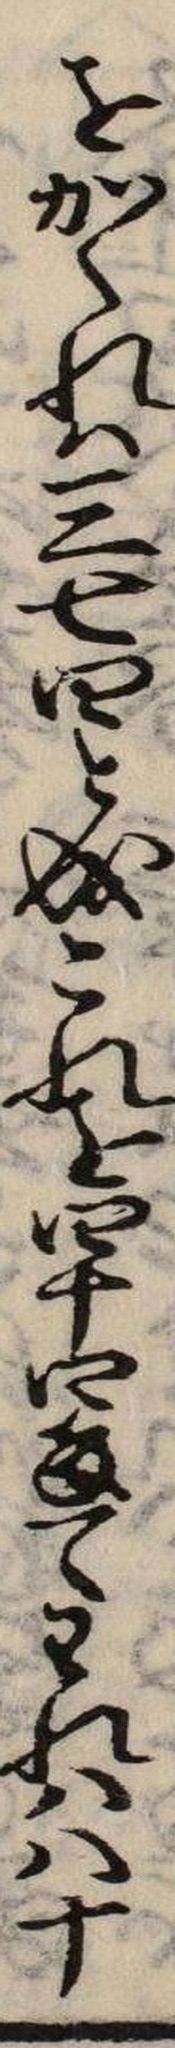をかくれは三七四と成これを四十四匁てわれは八十
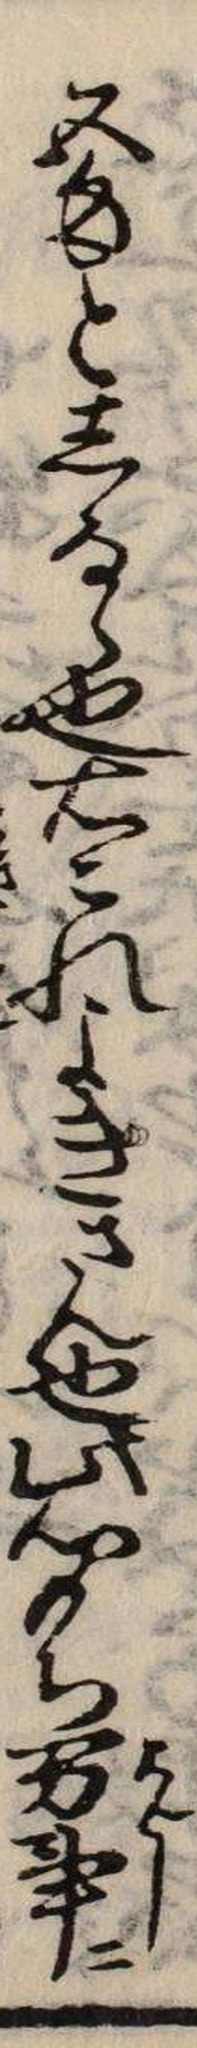五匁としるゝ也右これよきさん也此心もち万事によし
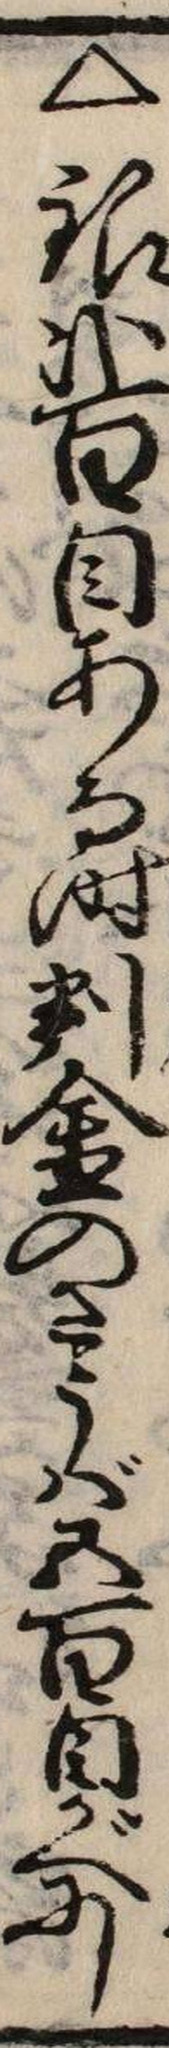△銀弐百目ある時判金のさうば五百目がへにし
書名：塵劫記（寛永11年自跋、京都府立京都学・歴彩館追貴8）
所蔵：京都府立京都学・歴彩館 国文学研究資料館
